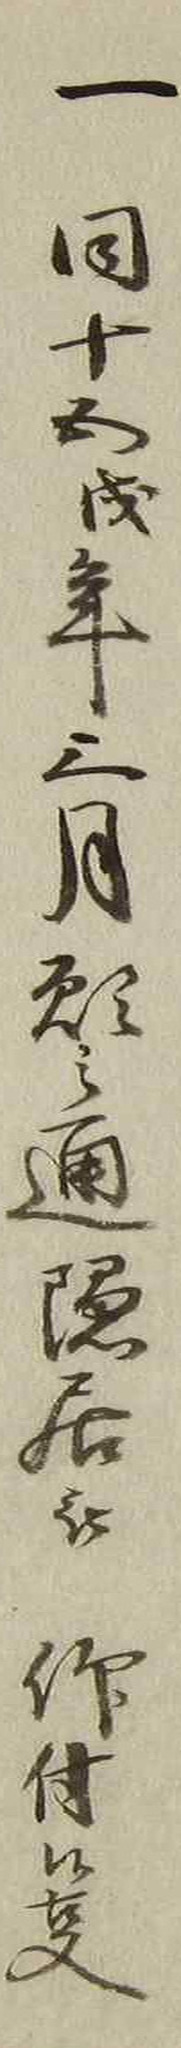一同十五戌年三月願之通隠居被仰付候事
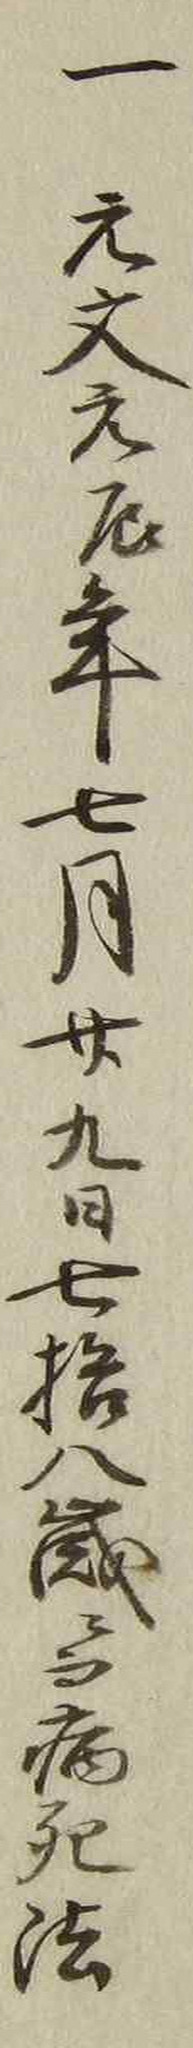一元文元辰年七月廿九日七拾八歳ニ而病死法
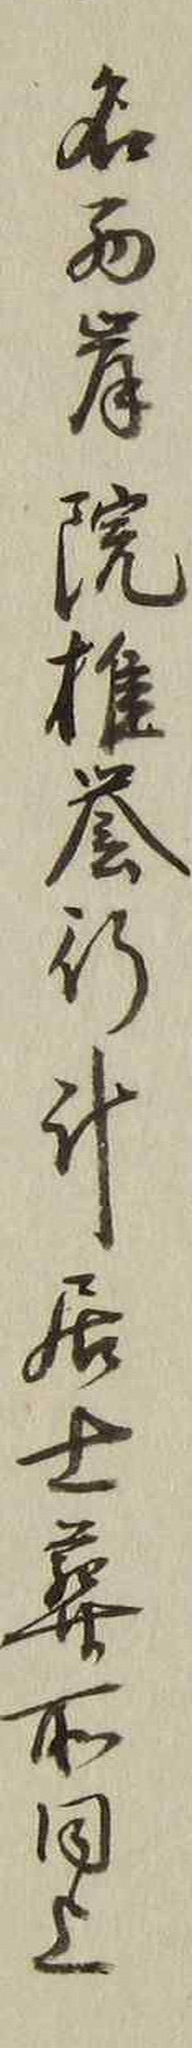名西岸院推誉行計居士葬所同上
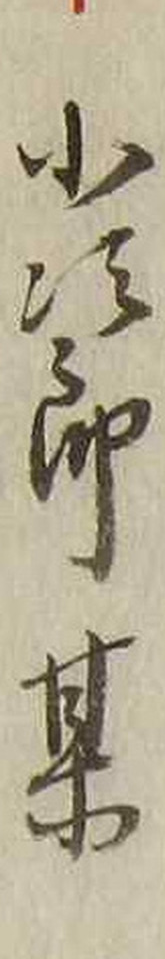小次郎某
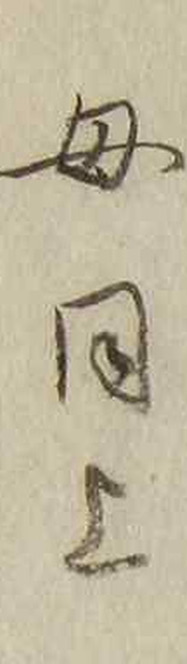母同上

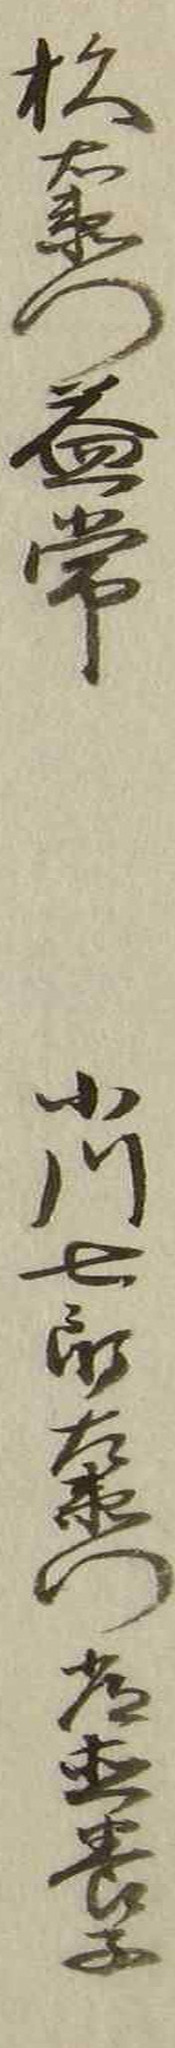杉右衛門益常小川七郎左衛門常直養子
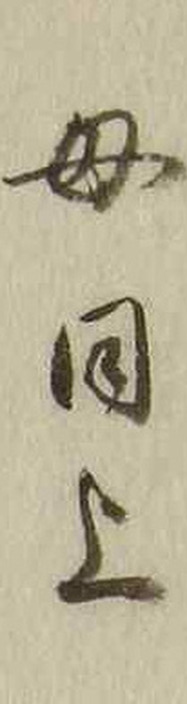母同上
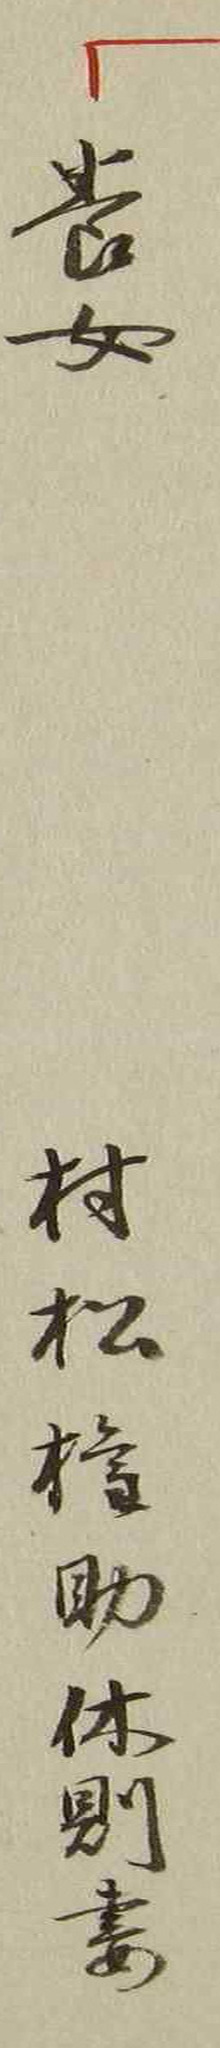養女村松権助休則妻
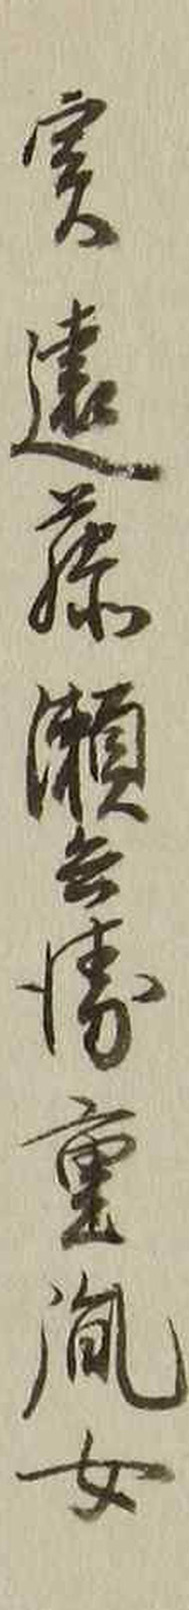実遠藤瀬兵衛重胤女
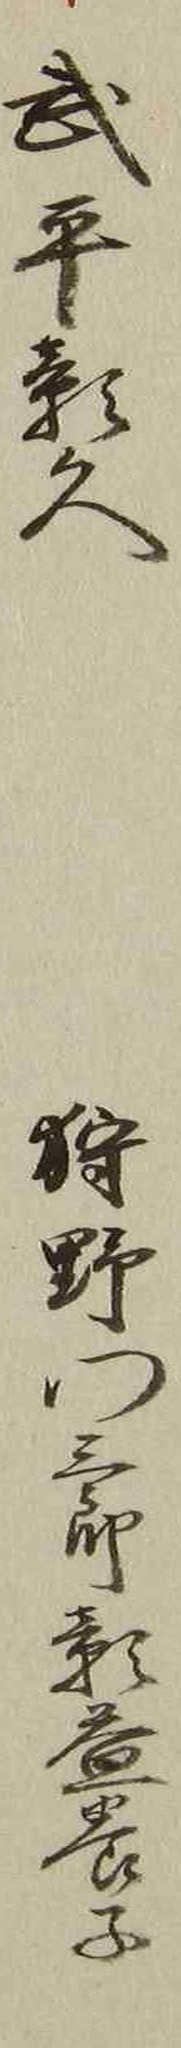武平彰久狩野門三郎彰益養子
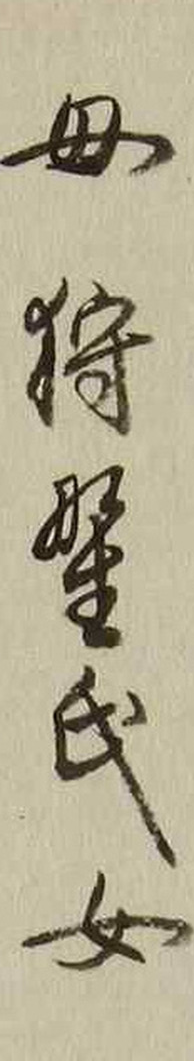母狩野氏女
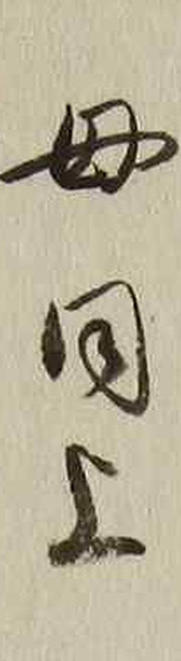母同上
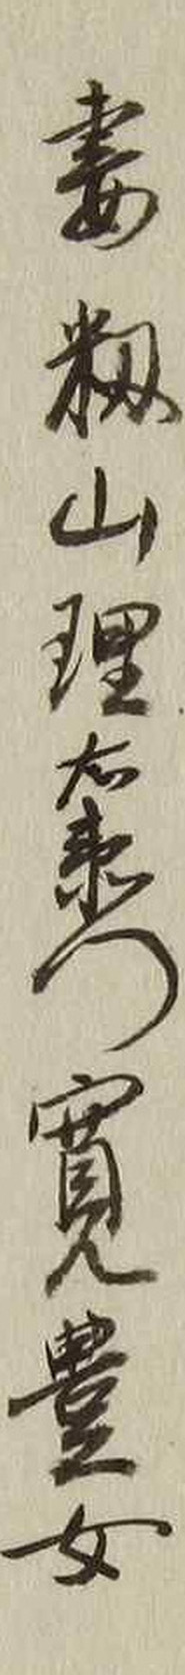妻籾山理右衛門寛豊女
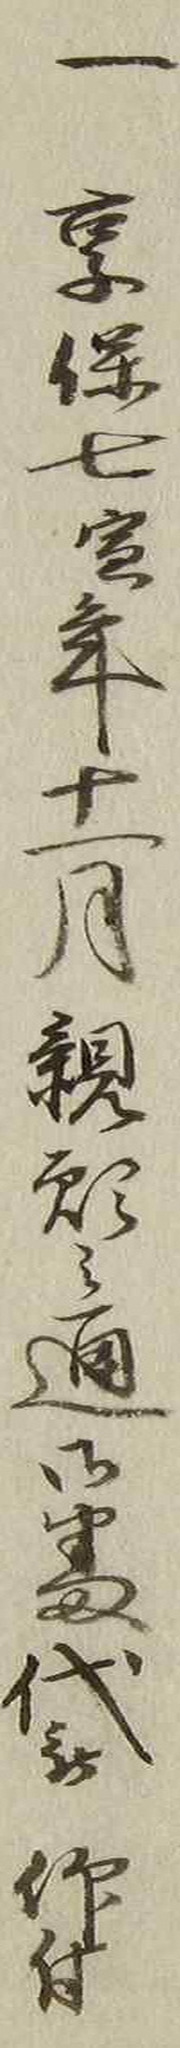一享保七寅年十一月親願之通御番代被仰付
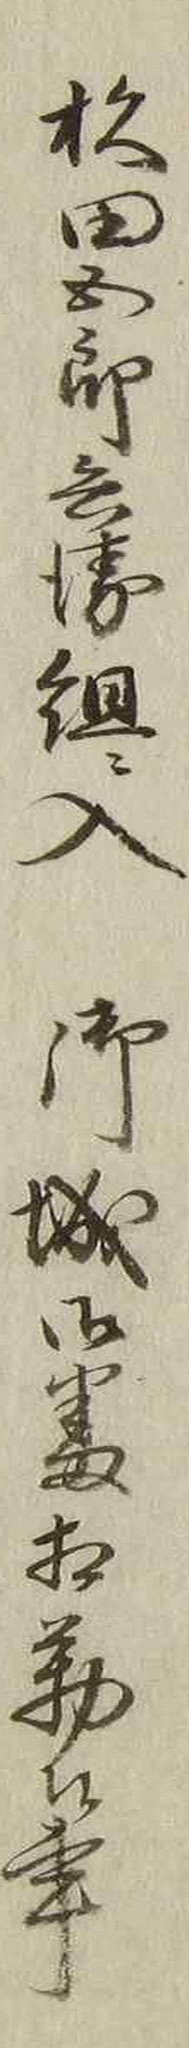杉田五郎兵衛組ニ入御城御番相勤候事
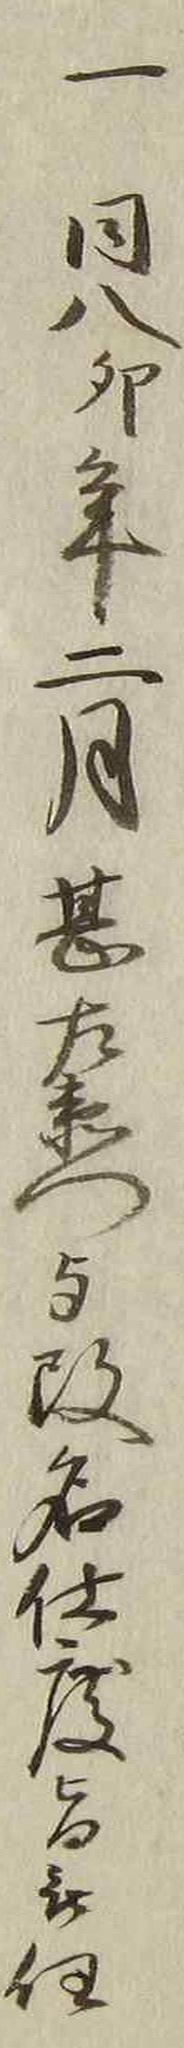一同八卯年二月甚左衛門与改名仕度旨被任
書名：諸士系譜　巻之128　た之部4
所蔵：会津若松市立会津図書館
